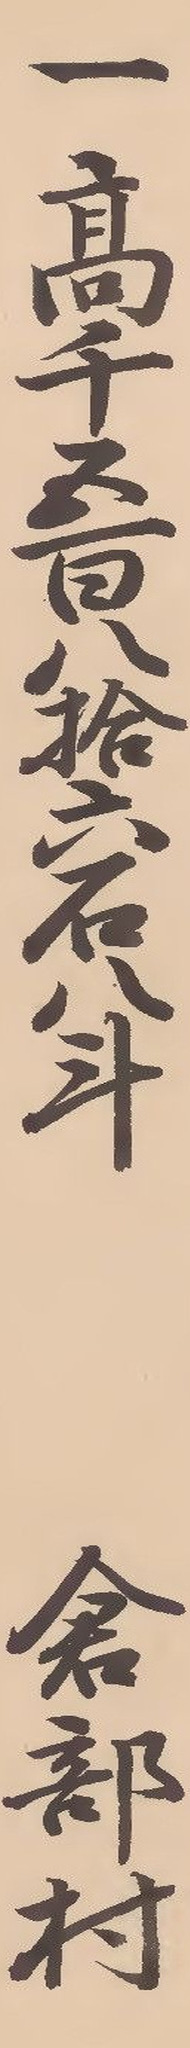一高千五百八拾六石八斗倉部村
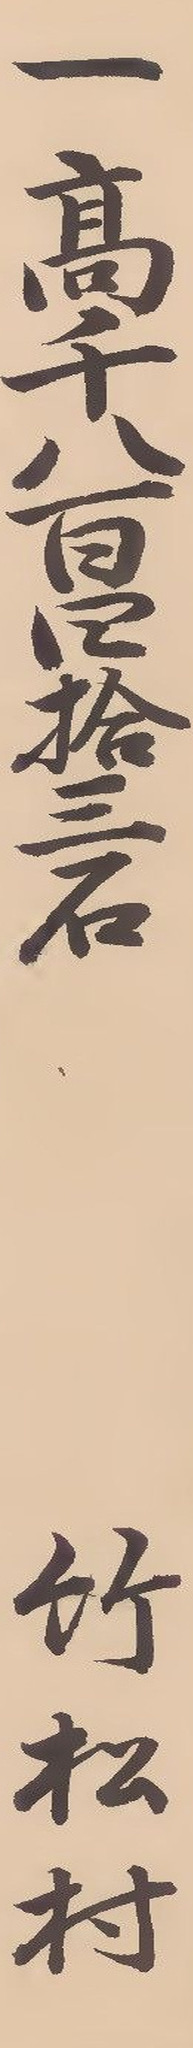一高千八百四拾三石竹松村
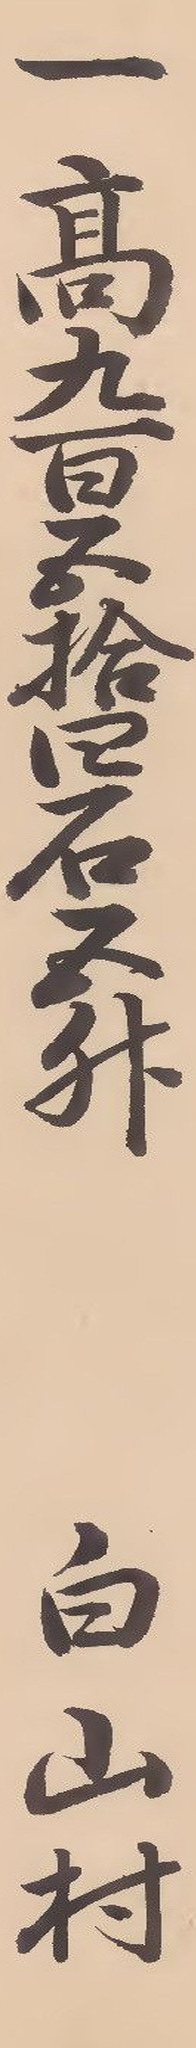一高九百五拾四石五升白山村
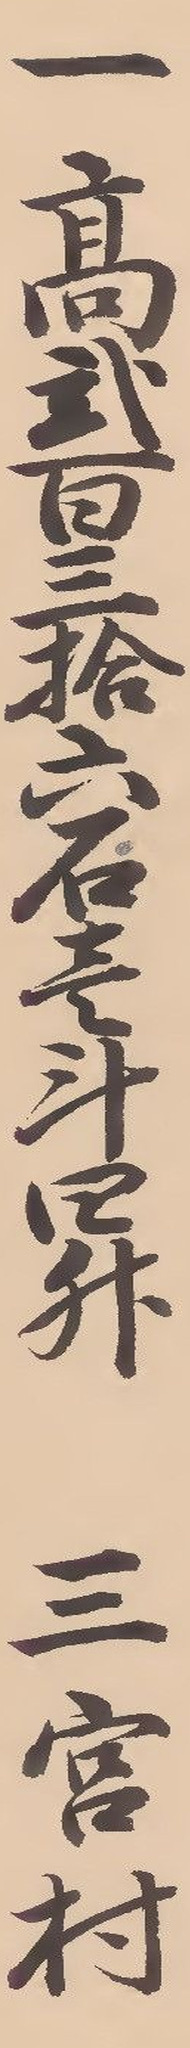一高弐百三拾六石壱斗四升三宮村

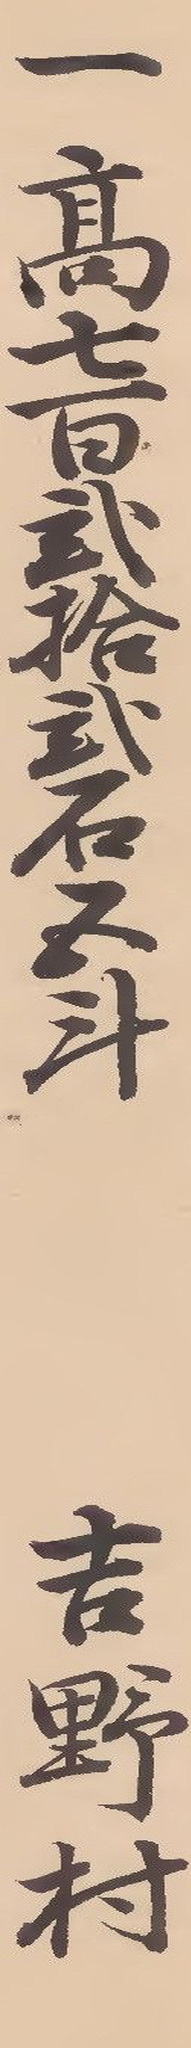一高七百弐拾弐石五斗吉野村
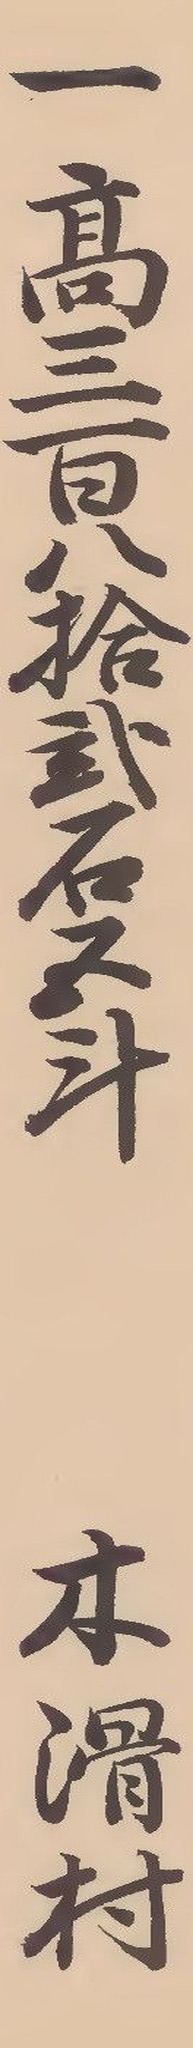一高三百八拾弐石五斗木滑村
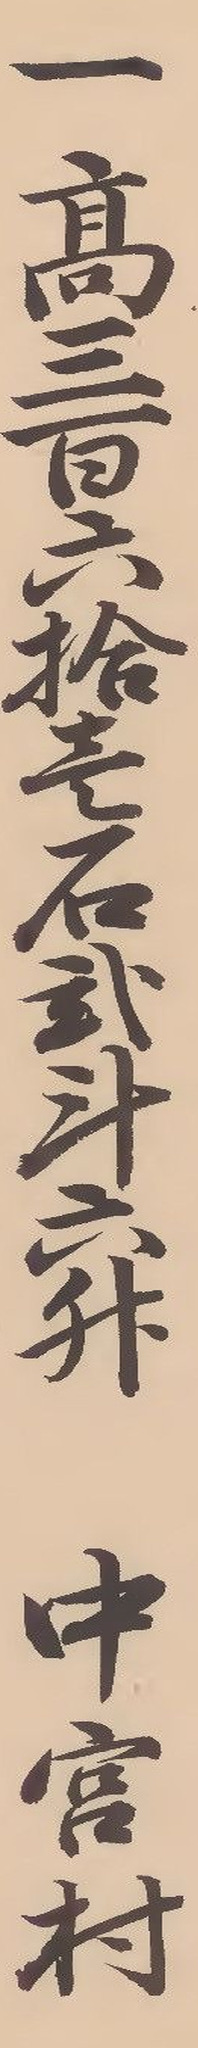一高三百六拾壱石弐斗六升中宮村
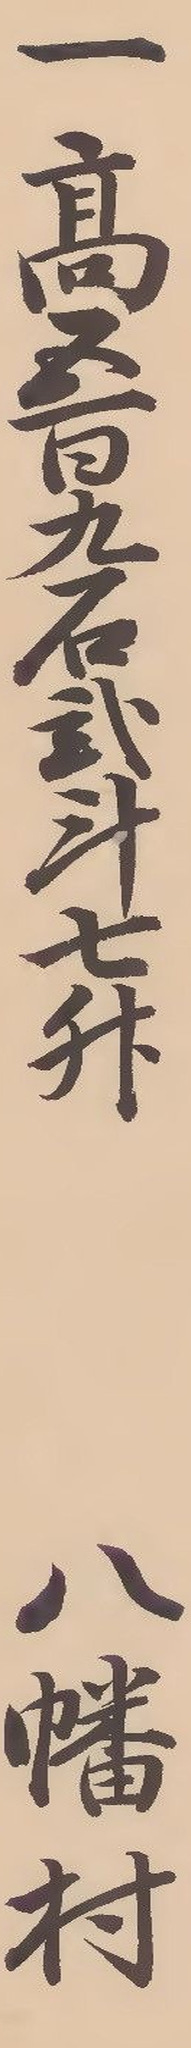一高五百九石弐斗七升八幡村

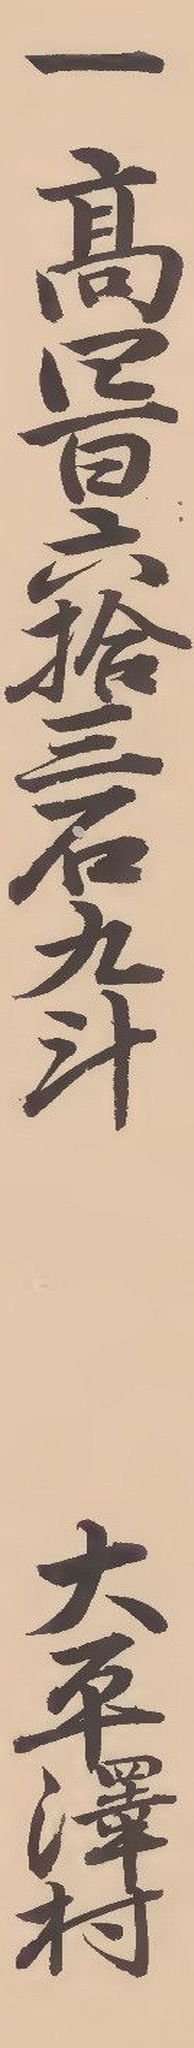一高四百六拾三石九斗大平沢村
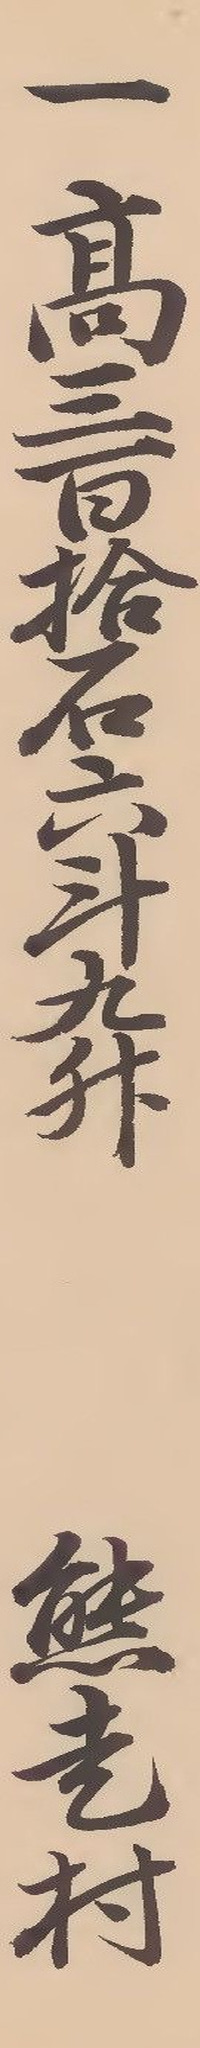一高三百拾石六斗九升熊走村
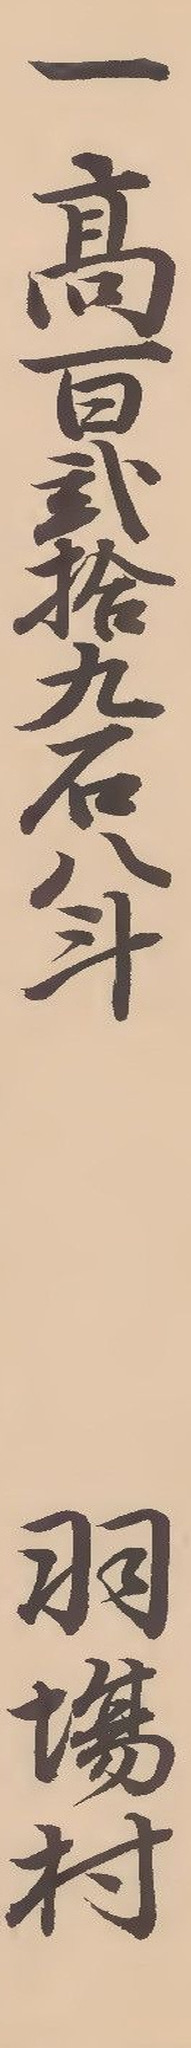一高百弐拾九石八斗羽場村
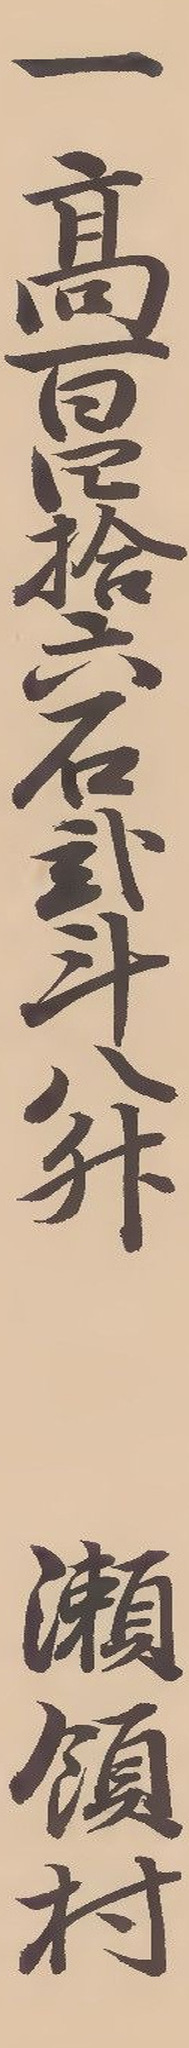一高百四拾六石弐斗八升瀬領村
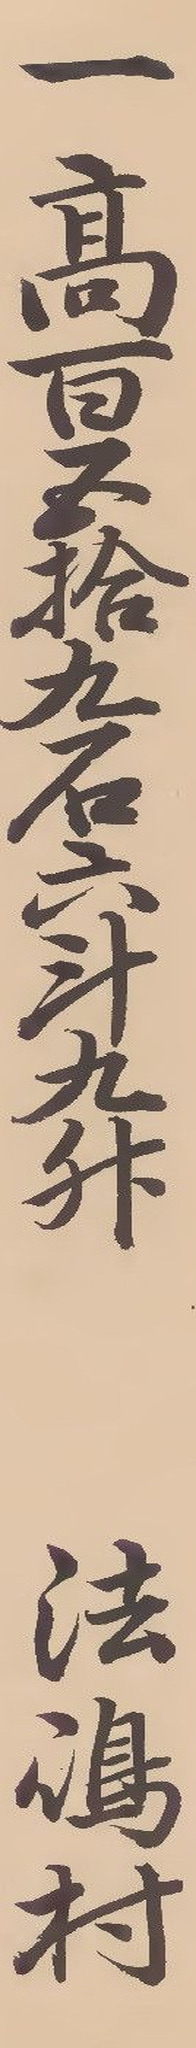一高百五拾九石六斗九升法島村

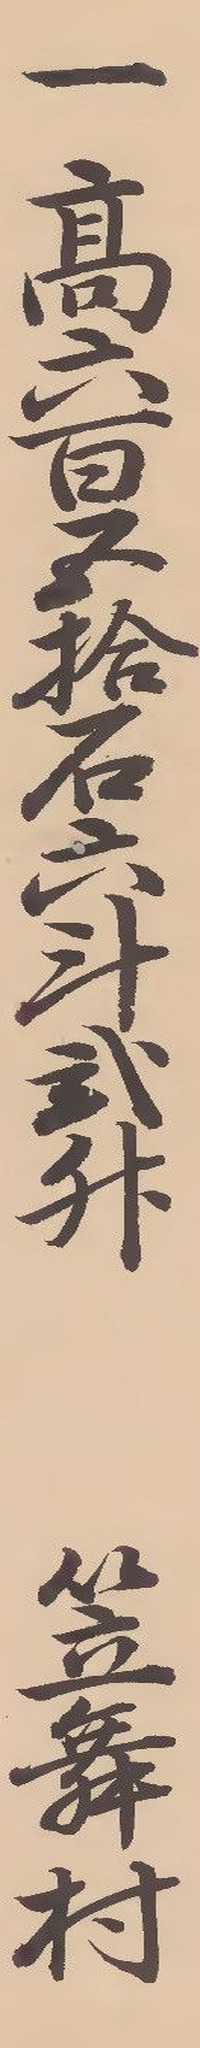一高六百五拾石六斗弐升笠舞村
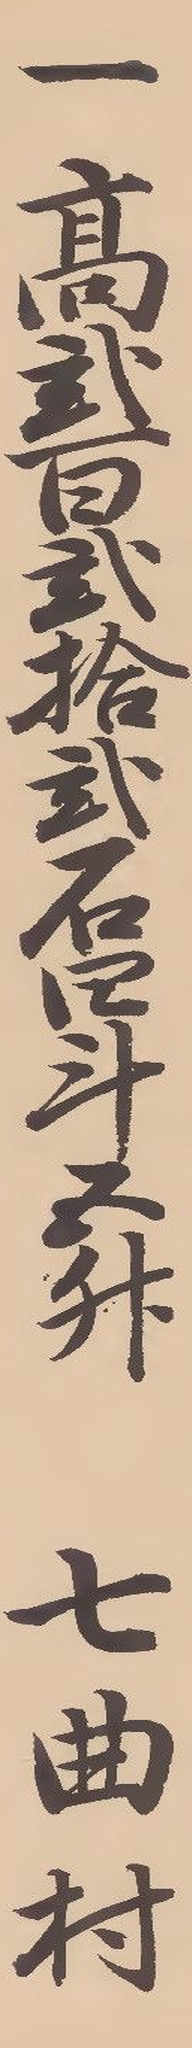一高弐百弐拾弐石四斗五升七曲村
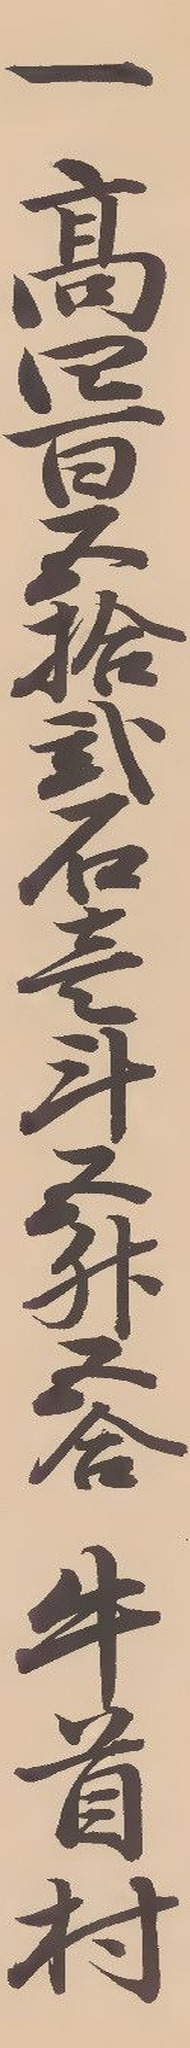一高四百五拾弐石壱斗五升五合牛首村
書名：加賀国郷帳
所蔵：国立公文書館 National Archives of Japan
